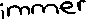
immer
